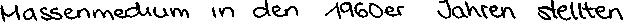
Massenmedium in den 1960er Jahren stellten
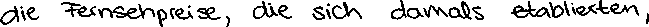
die Fernsehpreise, die sich damals etablierten,
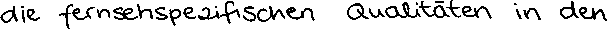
die fernsehspezifischen Qualitäten in den
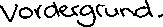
Vordergrund.
